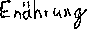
Ernährung
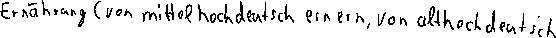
Ernährung (von mittelhochdeutsch ernern, von althochdeutsch
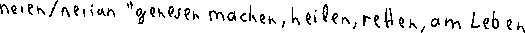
neren/nerian "genesen machen, heilen, retten, am Leben
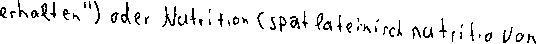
erhalten") oder Nutrition (spätlateinisch nutritio von
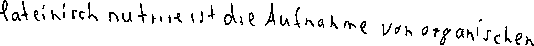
lateinisch nutrire ist die Aufnahme von organischen
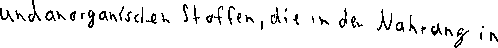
und anorganischen Stoffen, die in der Nahrung in
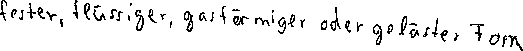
fester, flüssiger, gasförmiger oder gelöster Form
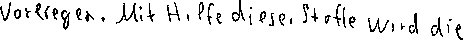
vorliegen. Mit Hilfe dieser Stoffe wird die
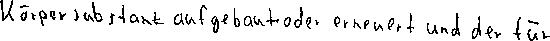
Körpersubstanz aufgebaut oder erneuert und der für
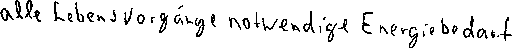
alle Lebensvorgänge notwendige Energiebedarf
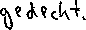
gedeckt.
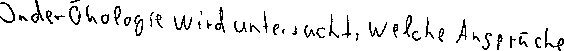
In der Ökologie wird untersucht, welche Ansprüche
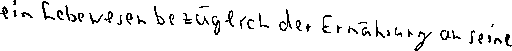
ein Lebewesen bezüglich der Ernährung an seine
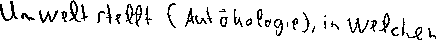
Umwelt stellt (Autökologie), in welchen
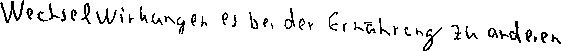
Wechselwirkungen es bei der Ernährung zu anderen
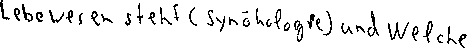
Lebewesen steht (Synökologie) und welche
